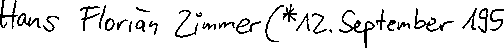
Hans Florian Zimmer (* 12. September 1957
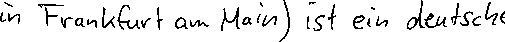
in Frankfurt am Main) ist ein deutscher
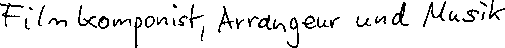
Filmkomponist, Arrangeur und Musik
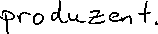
produzent.
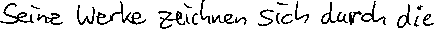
Seine Werke zeichnen sich durch die
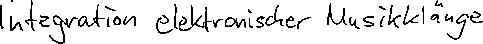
Integration elektronischer Musikklänge
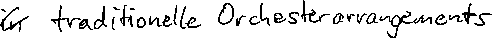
in traditionelle Orchesterarrangements
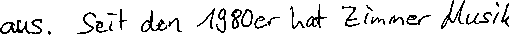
aus. Seit den 1980er Jahren hat Zimmer Musik
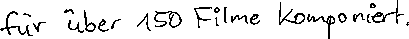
für über 150 Filme komponiert.
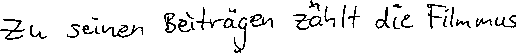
Zu seinen Beiträgen zählt die Filmmusik
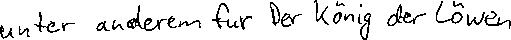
unter anderem für Der König der Löwen
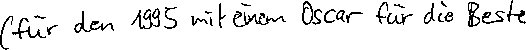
(für den er 1995 mit einem Oscar für die Beste
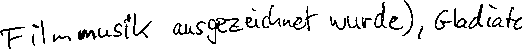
Filmmusik ausgezeichnet wurde), Gladiator
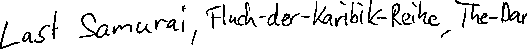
Last Samurai, Fluch-der-Karibik-Reihe, The-Dar
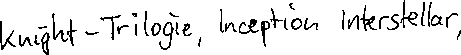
Knight-Trilogie, Inception, Interstellar,
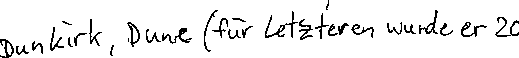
Dunkirk, Dune (für Letzteren wurde er 20
